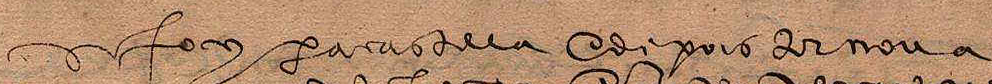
se foy ꝑa castella e depois tornou a
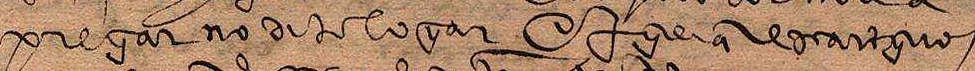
pregar no dito logar e Jgreia descarēguo
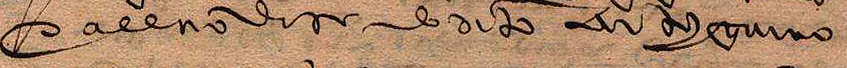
e all nō dise do dito artyguuo
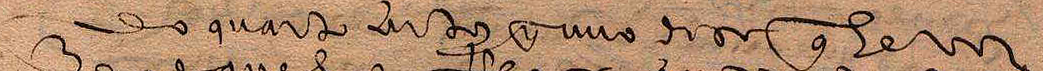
item do quarto artyguuo dise q̄ he ver
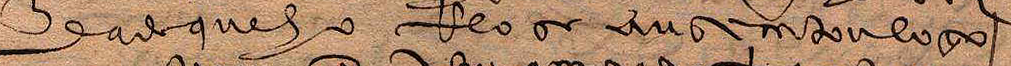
dade que ho Reo se ausemtou logo
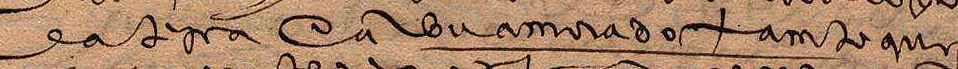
da terra e ādou amorado tamto que
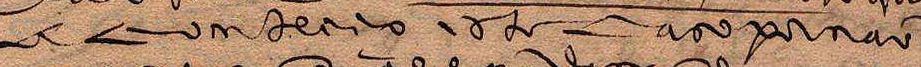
acomteçeo este caso por naõ
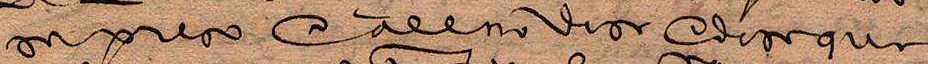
ser preso e all nō dise e dise que
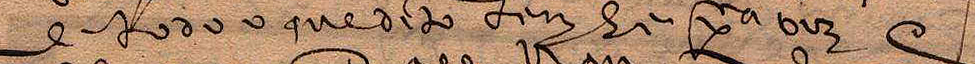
de todo o que dit̄o tem he p̄ca voz e
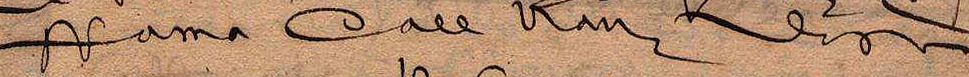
ffama e all Nam dise
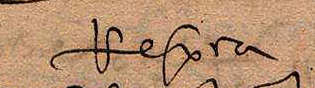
Rep̄ca
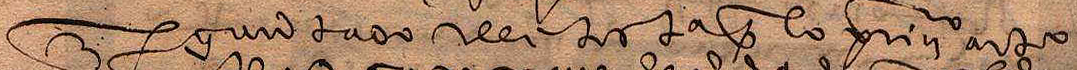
item ꝑguntado elle testa p̄lo primro arto
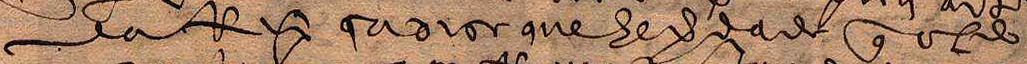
da Rep̄ca dise que he ꝟdade q̄ o Ldo
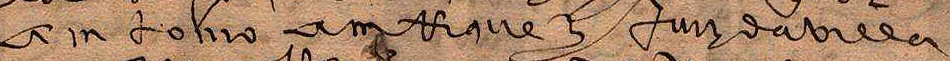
amtonio amRiquez Juiz da villa
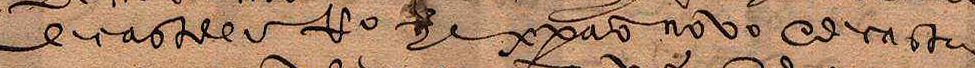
de castello Ro he xpaõ novo e de casta
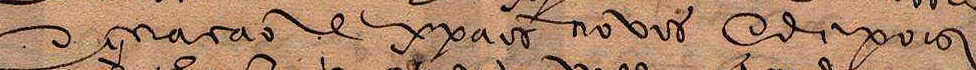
e geracaõ de xpaos̄ novos e depois
